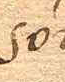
Sor̄
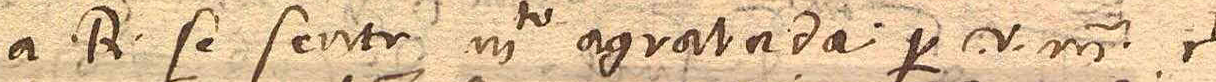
a .R. se sente mto agravada ꝑ .V. m̄. ē
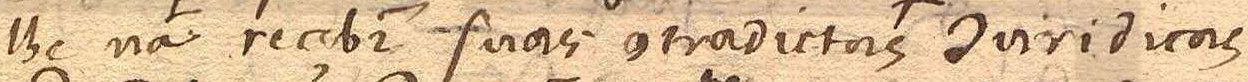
lhe nā reçebr̄ suas ꝯtradictas Juridicas
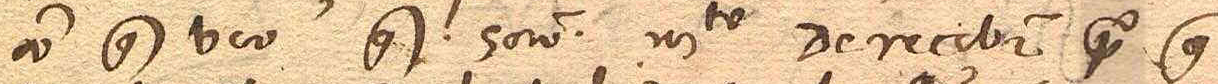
cō q̄ veo q̄ . saõ mto de reçebr̄ p̄o q̄
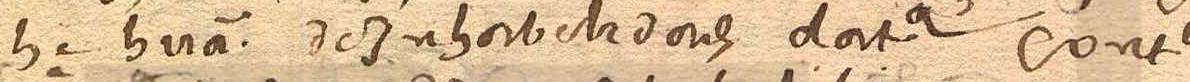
he huā. de Jnhabelidas da ta e outa
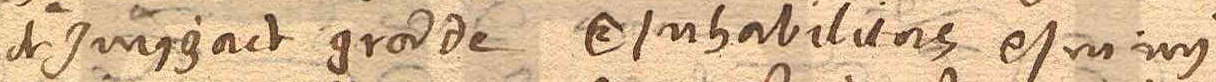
de Jmjzade grāde e Jnhabilitas e Jnimj
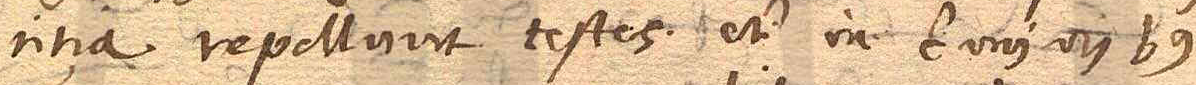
titia repellunt testes. et̄ in cimjnjbꝯ
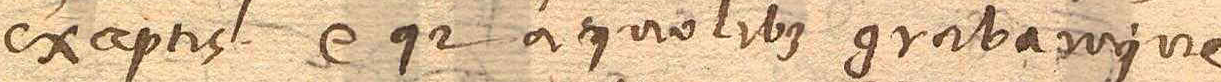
exceptis e qr a quolibꝫ gravamjne
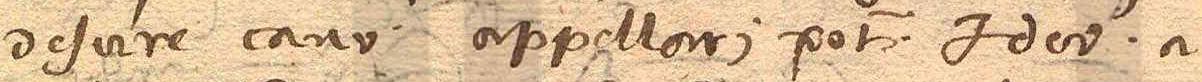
de Jure cano. appellarj xot̄. Jdeo . a
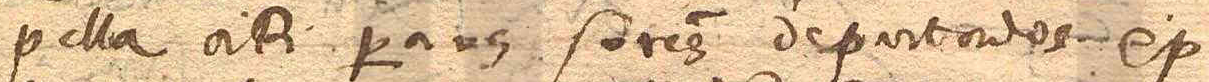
pella a .R. ꝑa os sorē deputados e p.
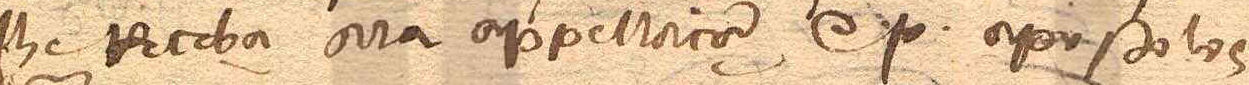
lhe Receba sua appelaçā e .p. apostolos
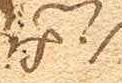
cꝭ̄./
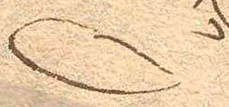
Co
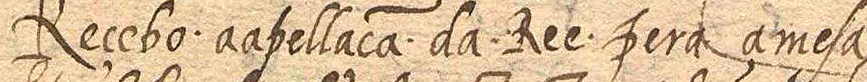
Reçebo. a apellaçā. da Ree. pera a mesa
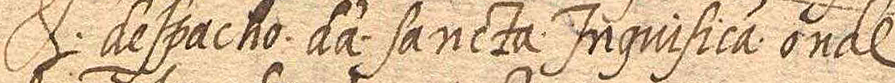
&. despacho. da. sancta. Jnquisicā. onde
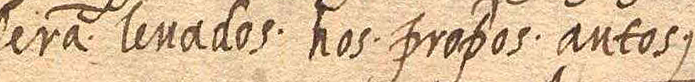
serā. leuados. hos. propios. autos
